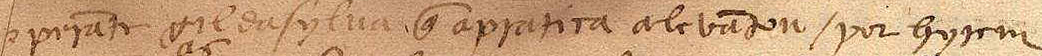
e per̄ate gil da sylua q̄ a pratica alevātou / por hyrem
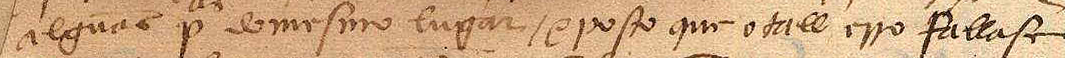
algūas pas do mesmo lugar / e posto que o tall erro fallase
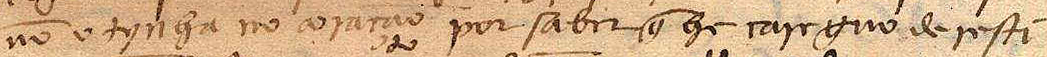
n̄o o tynha no coração por saber q̄ he careguo de resti
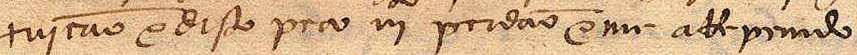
ujcão e disto peco mto perdão e me aRepemdo
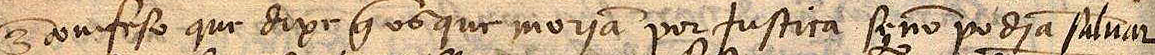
item comfeso que dixe q̄ os que morjā por Justica se n̄o podjā saluar
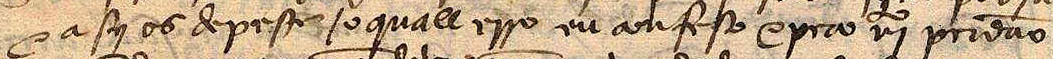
e asy os de peste / o quall erro eu confeso e peco mto perdão
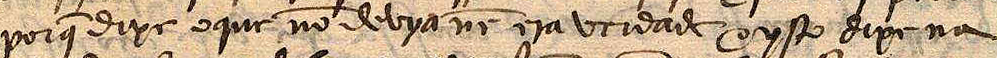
porq̄ dixe o que n̄o devya n̄e era verdade e ysto dixe na
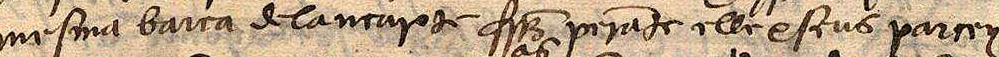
mesma barca de lancarote frr̄z per̄ante elle e seus parcey
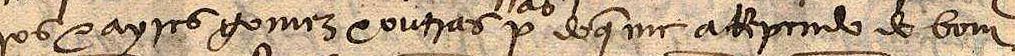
ros e ayres gomez e outras pas de q̄ me aRependo de bom
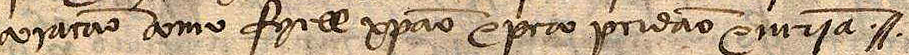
coracão como fyell xpão e peco perdão e mr̄ja .//.
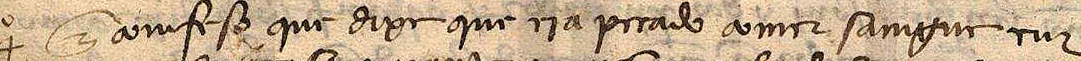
item comfeso que dixe que era pecado comer samgue em
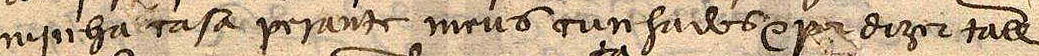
mjnha casa perante meus cunhados e por dizer tall
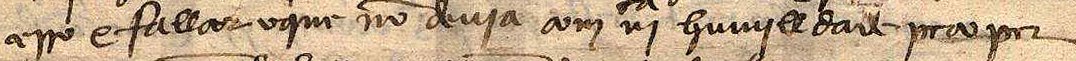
erro e fallar o que n̄o deuja com mta humjlldade peco per
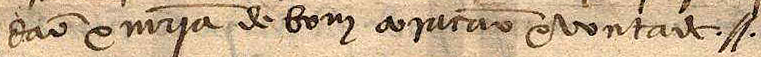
daõ e mr̄ja de bom coracão e vontade .//.
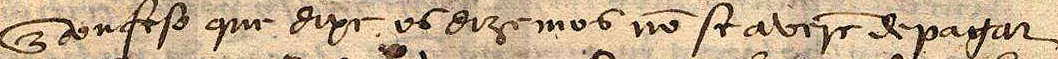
item confeso que dixe os dizemos nō se aver̄em de pagar
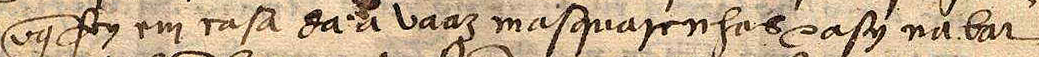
o q̄ foy em casa da ao vaaz masquarenhas e asy na bar
